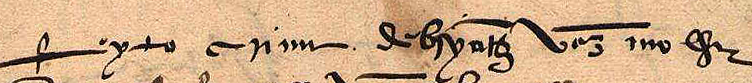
feyto crime de brȳatiz vāz molher
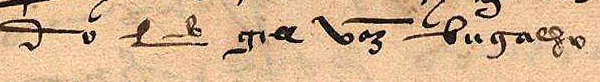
do Ldo gil vāz bugalho
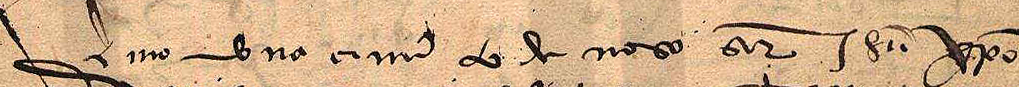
Ano do nacimēto de noso s̄or Jhū xp̄o
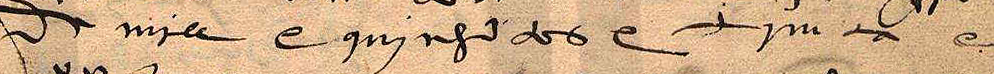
de mjll e qujnhētos e trinta e
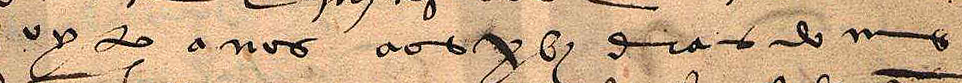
oyto anos aos xbj dias do mes
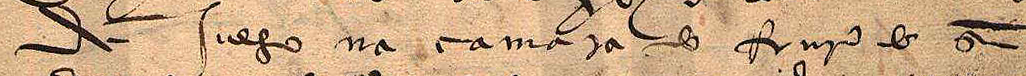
de Julho na camara do Reurēdo s̄or
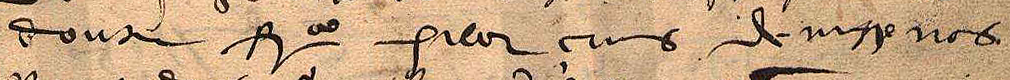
doutor frco pilorcius demtro nas
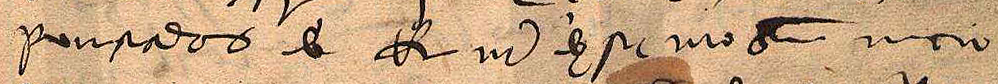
pousadas do Reurēdysimo s̄or nucio
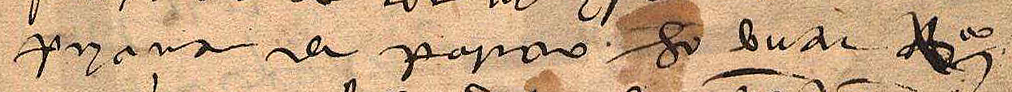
perante ele pareceo ho doutor vco
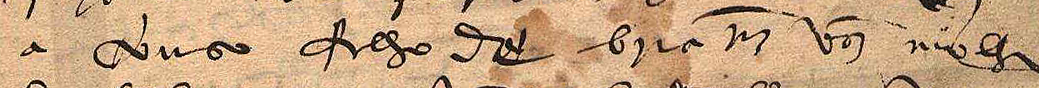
afonso filho de briatiz vāz molher
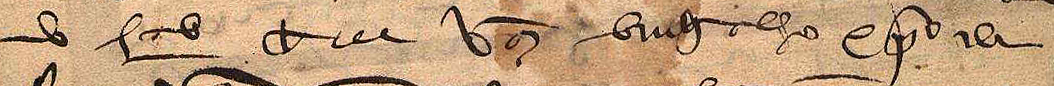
do Ldo gill vāz bugalho e p̄o ele
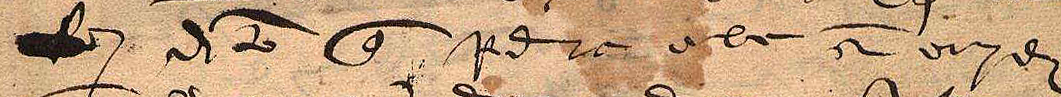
foj dito q̄ pedia a ele s̄or oujdor
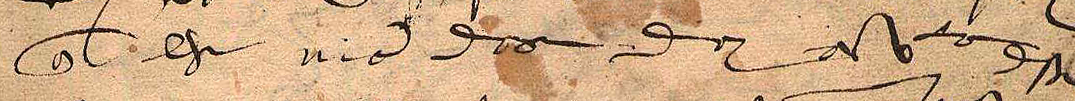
q̄ lhe mādase dar a vta deste
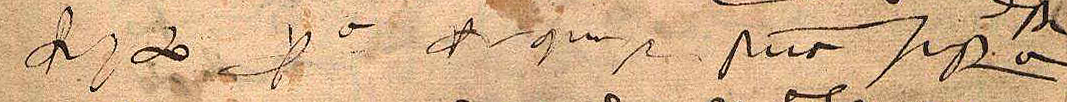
fejto ꝑa Requerer sua Justa
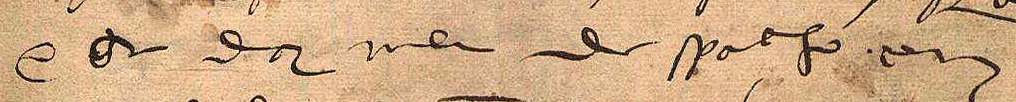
e se dar nele despacho com
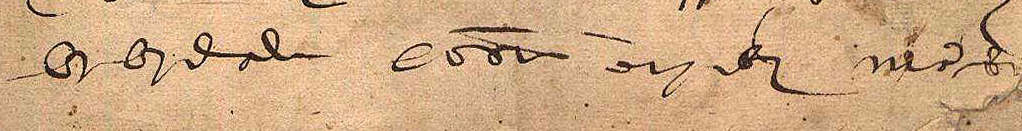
brebjdade e o s̄or oujdor mādou
